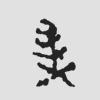味
